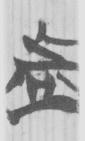者
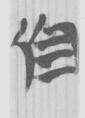於
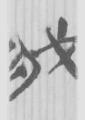我
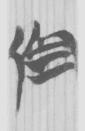於
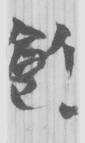飤
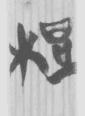梪
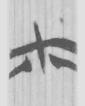尒
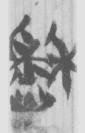稻
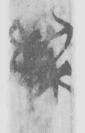{禾刅木}
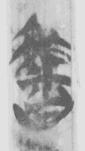{禾香}
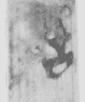{十四}
